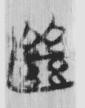㡭
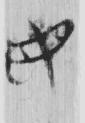母
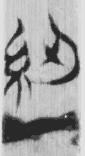紉
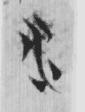水
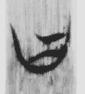曰
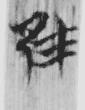隹
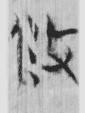攸
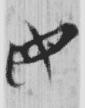母
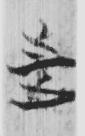{之止}
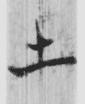土
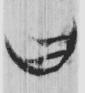曰
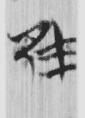隹
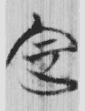定
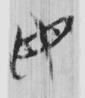母
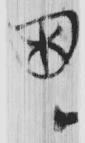困
